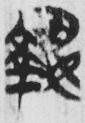執
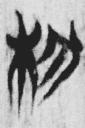○（畚）
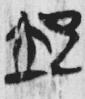○（耜）
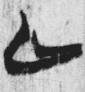㠯（以）
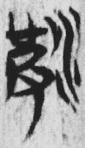波（陂）
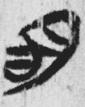明
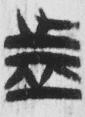者（都）
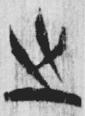之
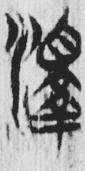澤
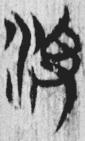決
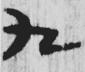九
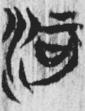河
